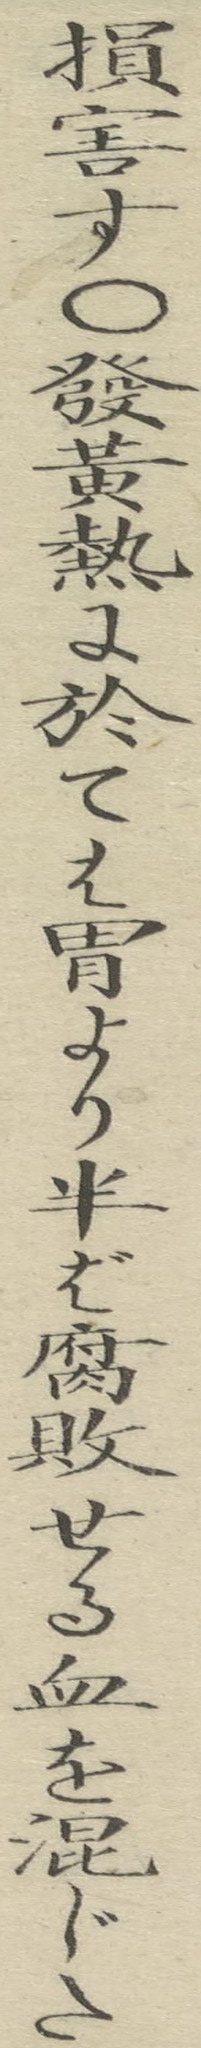損害す〇發黄熱に於ては胃より半ば腐敗せる血を混じた
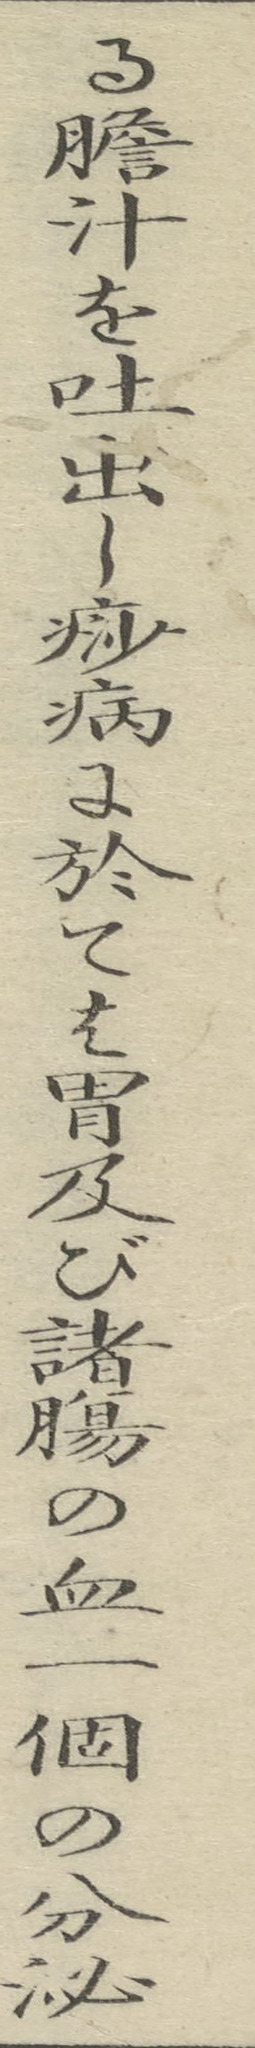る膽汁を吐出し痧病に於ては胃及び諸膓の血一個の分泌
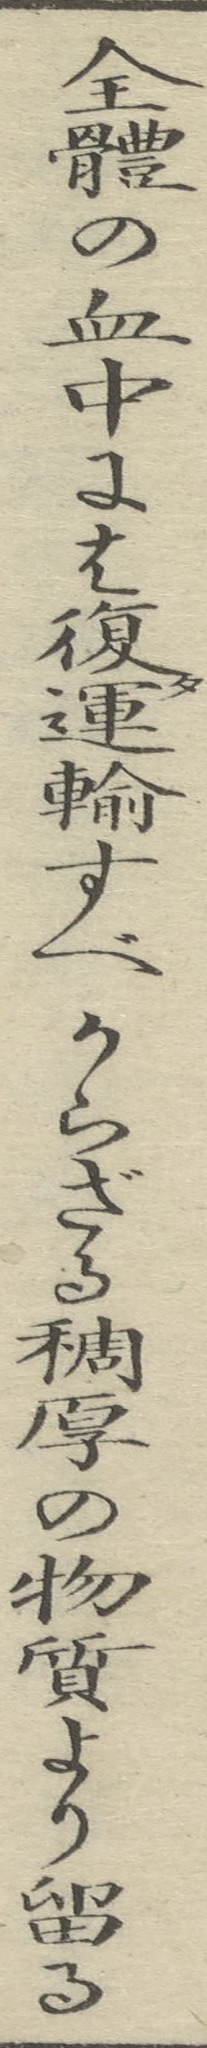全體の血中には復運輸すべからざる稠厚の物質より留る
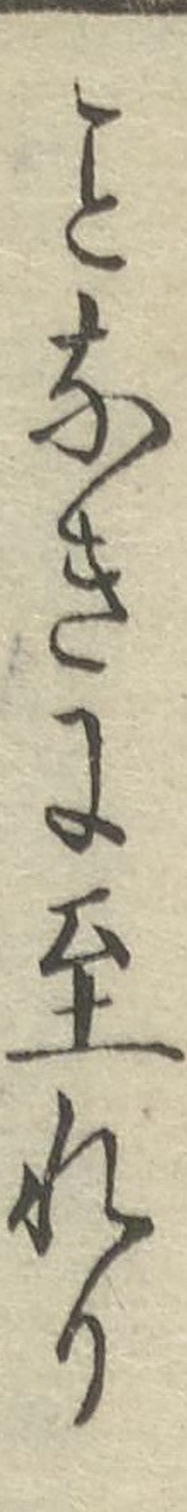ことなきに至れり
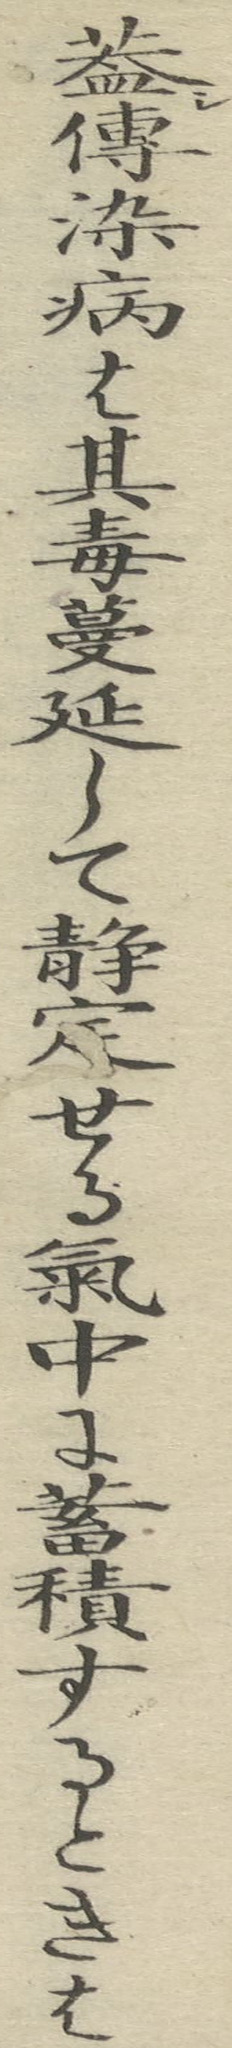葢傅染病は其毒蔓延して静定せる氣中に蓄積するときは
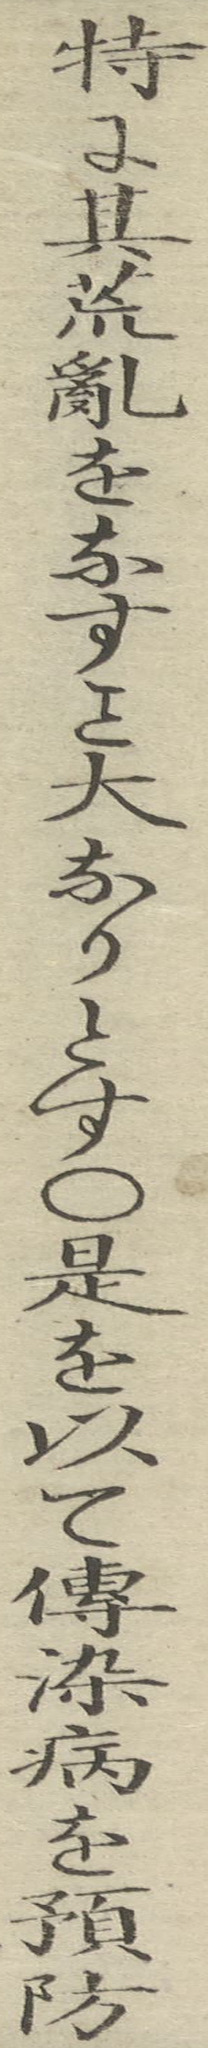特に其荒亂をなすこと大なりとす〇是を以て傅染病を預防
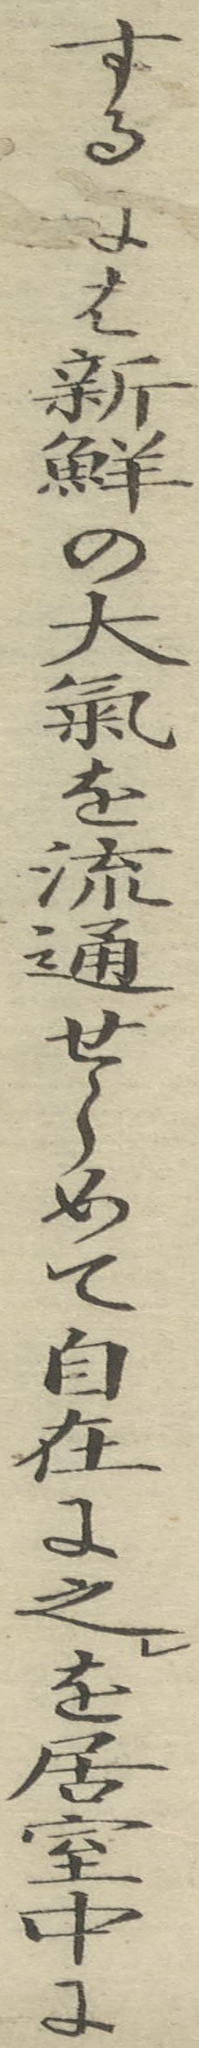するには新鮮の大氣を流通せしめて自在に之居室中に

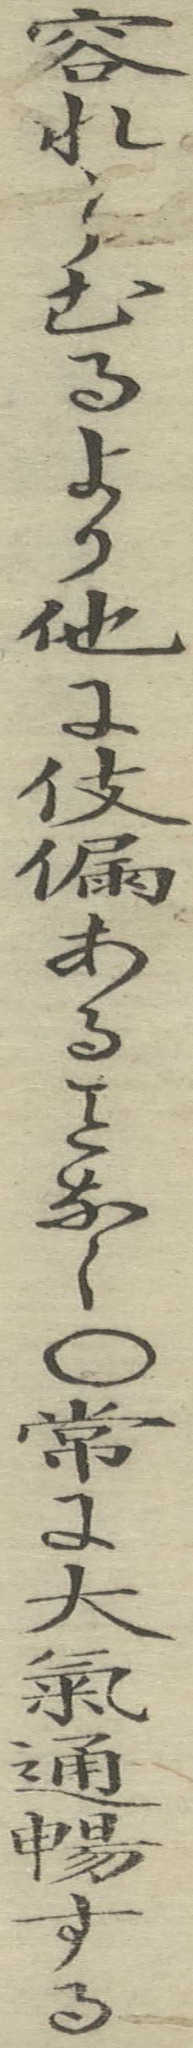容れしむるより他に伎漏あることなし〇常に大氣通暢する
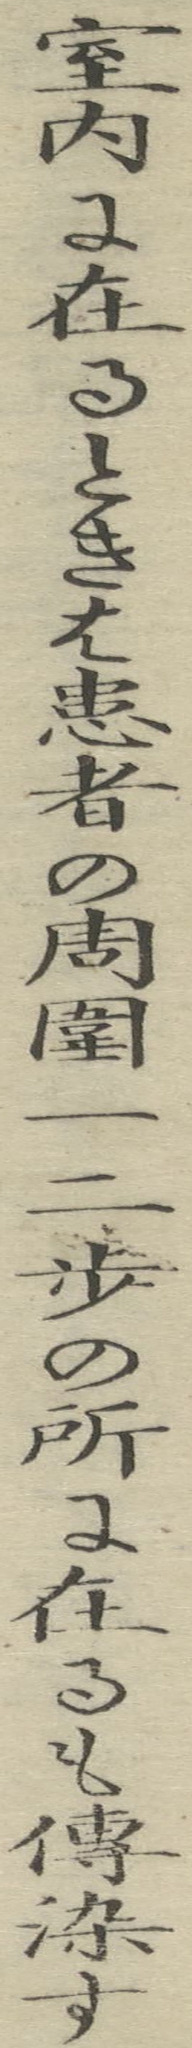室内に在るとは患者の周圍一二歩の所に在る傅染す
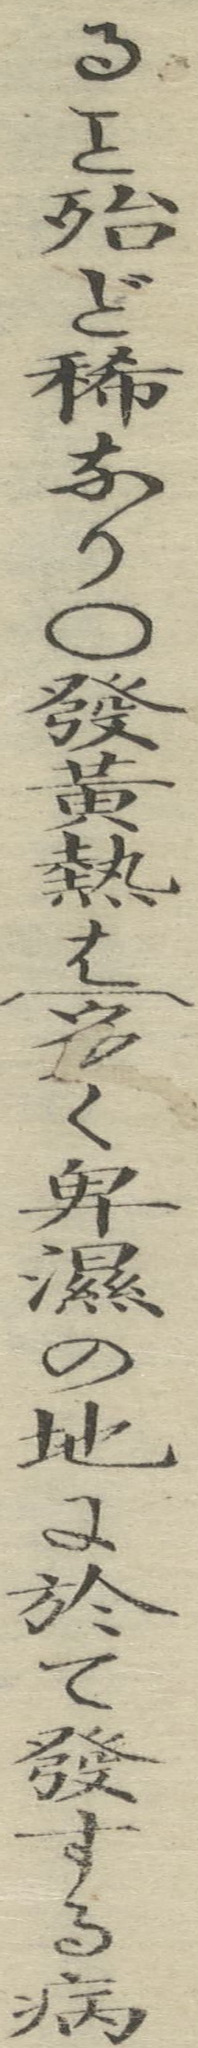ること殆ど稀なり〇發黄熱は[多く卑濕の地に於て發する
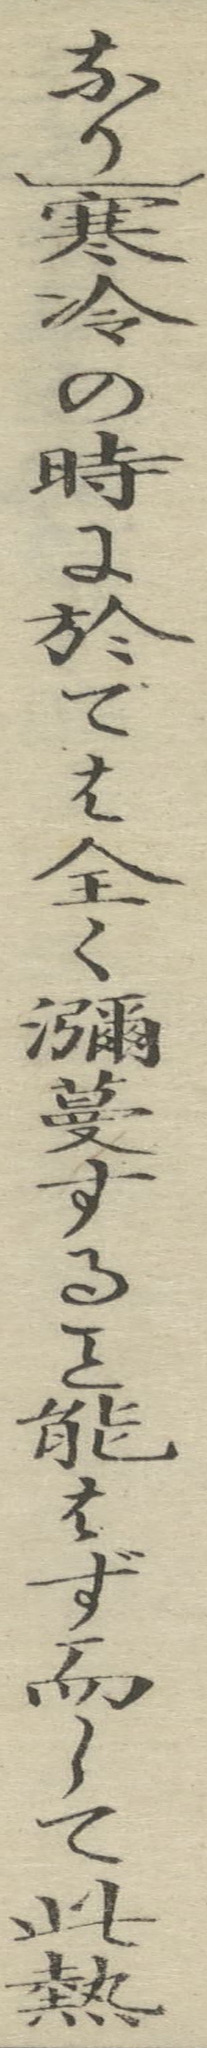なり]寒冷の時に於ては全く瀰蔓すること能はず而して此熱
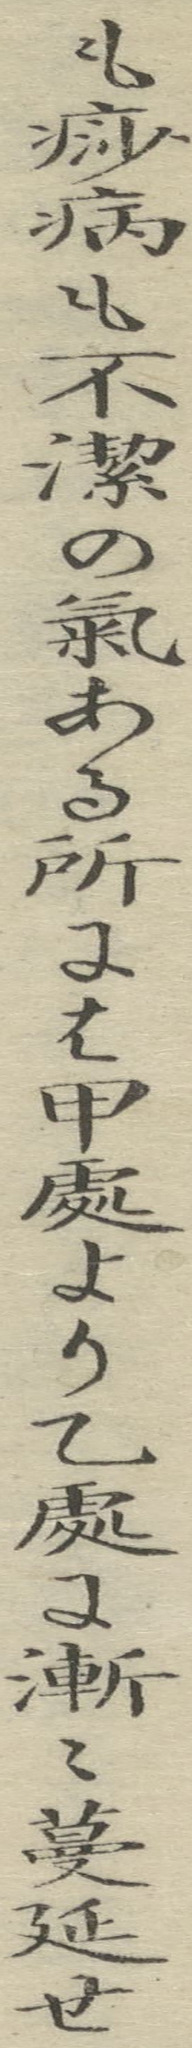も痧病も不潔の氣ある所には甲處より乙處に漸々蔓延せ
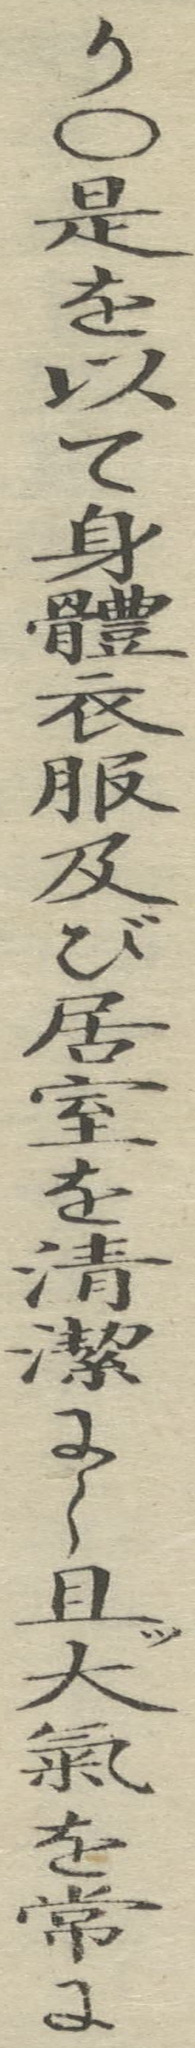り〇是を以て身體衣服及び居室を清潔にし且大氣を常に
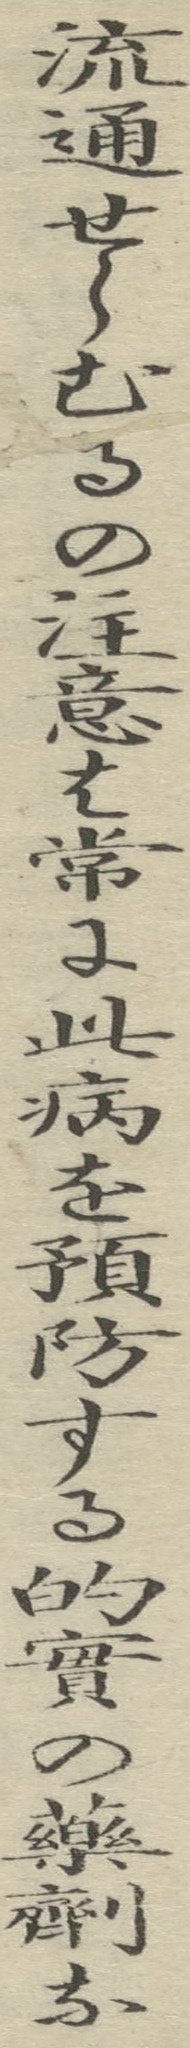流通せしむるの注意は常に此病を預防する的實の藥劑な
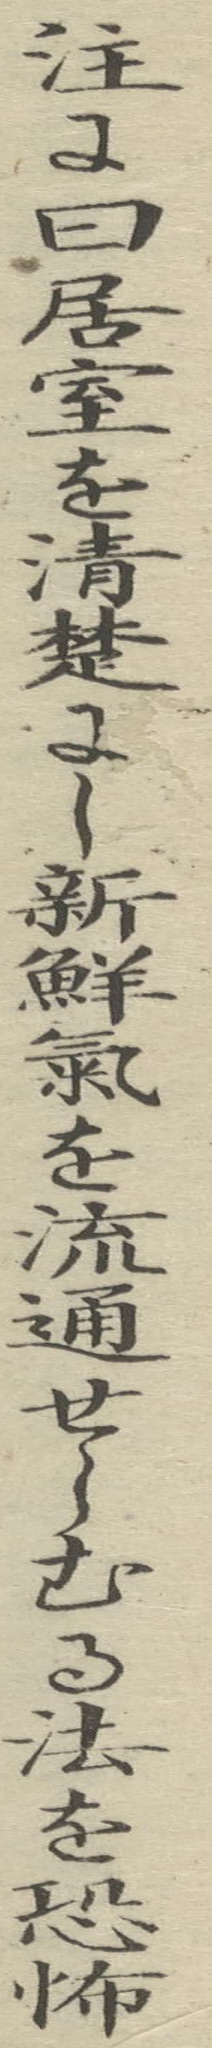注に曰居室を清楚にし新鮮氣を流通せしむる法を恐怖
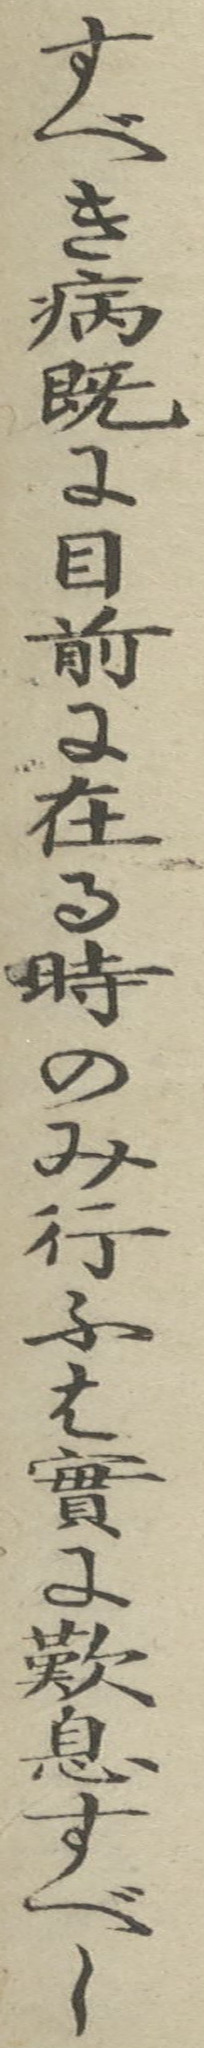すべき病既に目前に在る時のみ行ふは實に嘆息すべし
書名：官版疫毒預防説　全
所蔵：東京大学総合図書館 General Library in the University of Tokyo, JAPAN
